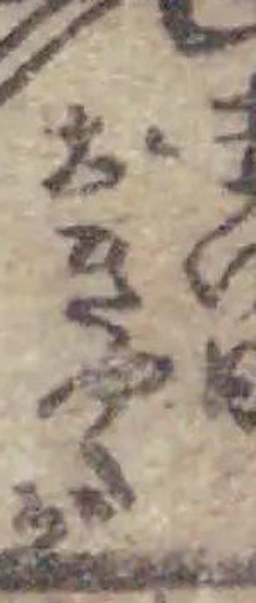おきやくが
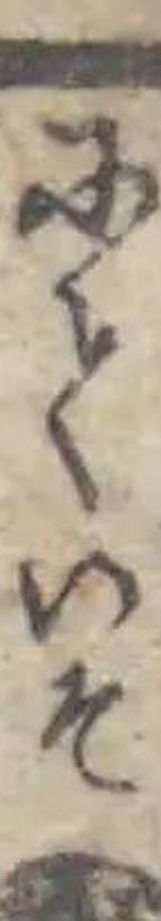にていそ
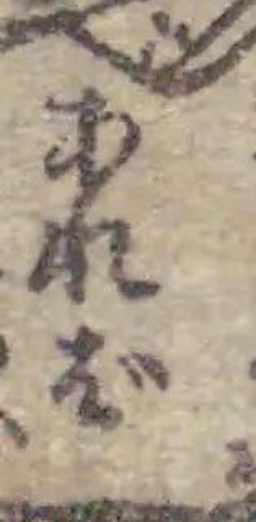あれば
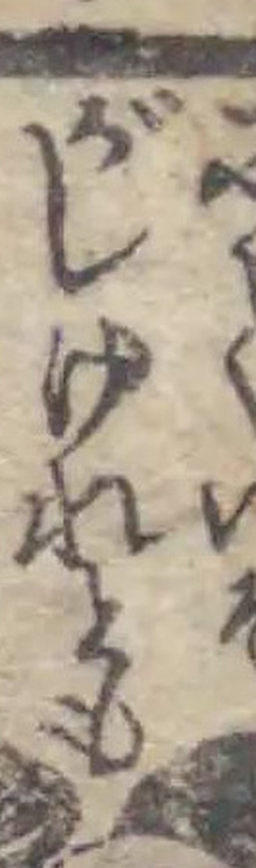がしけれとも
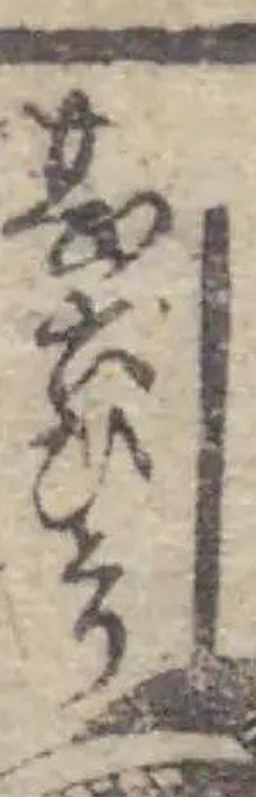甚六ひとり
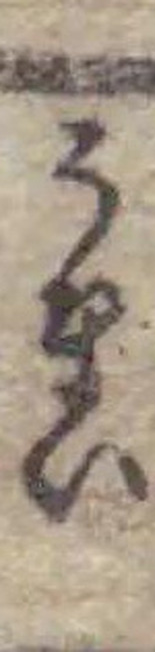うまい
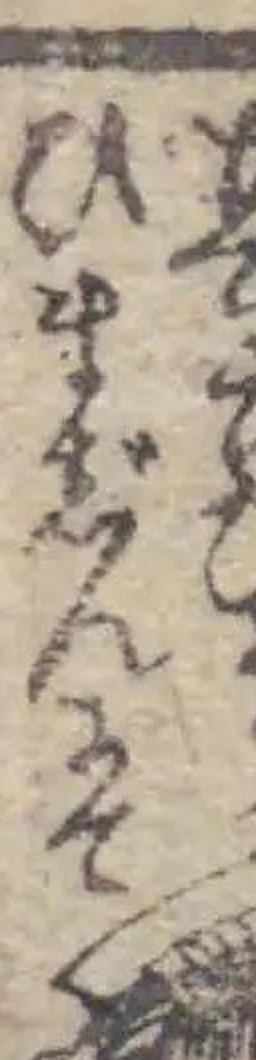ひまじんにて
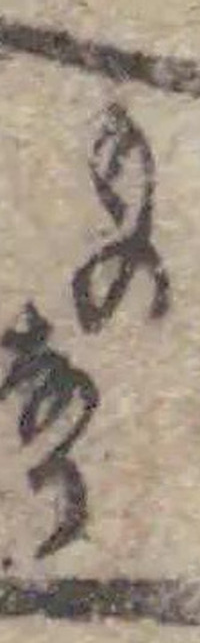ものなり
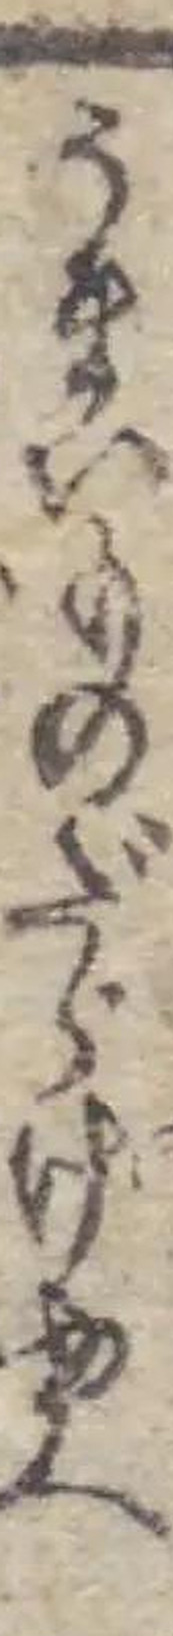うまいものだらけゆへ
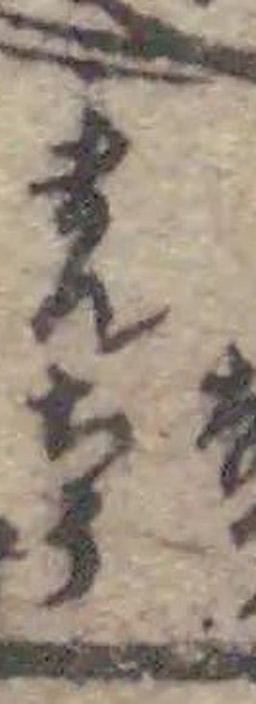まんちう
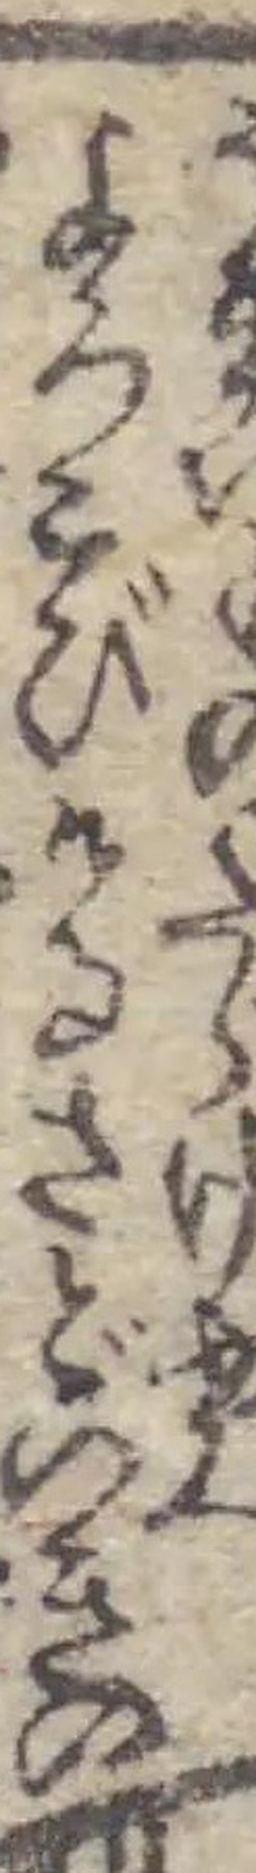よろこびけるさどいきの
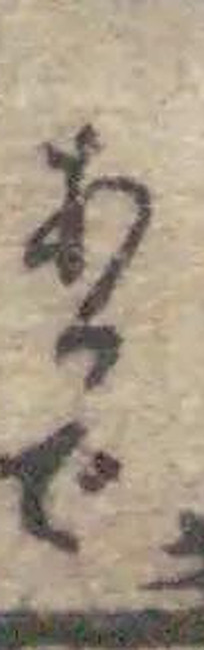あかで
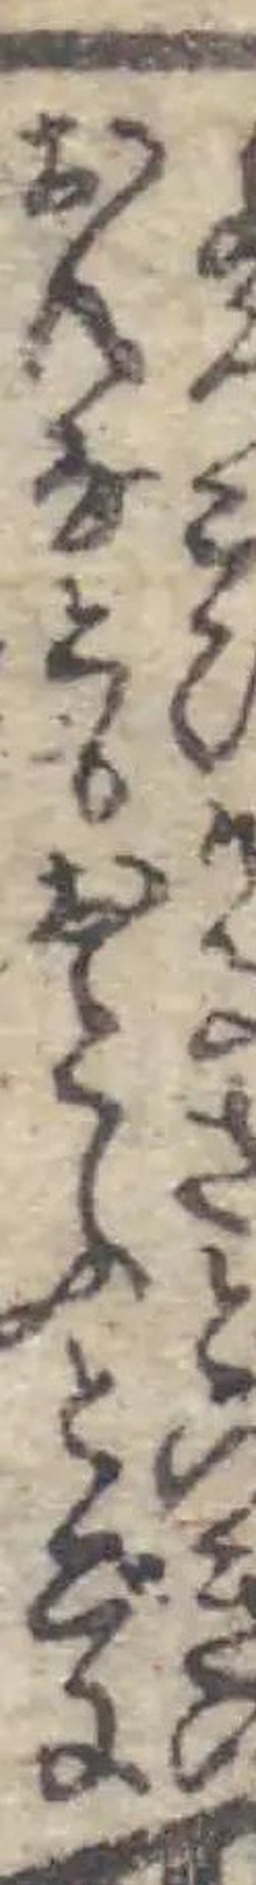おんなともおとふとごに
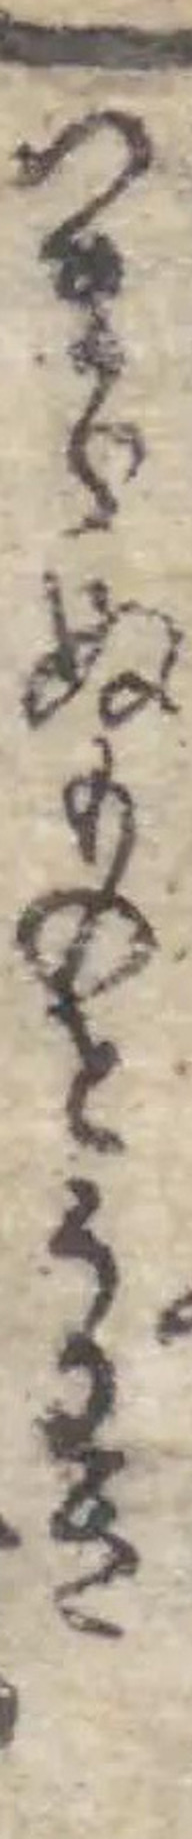つまらぬもをうわき
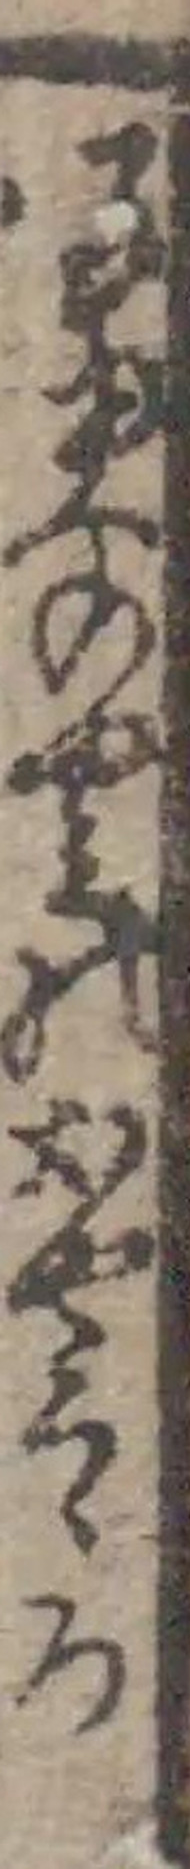子ゆへのやみのおやこゝろ
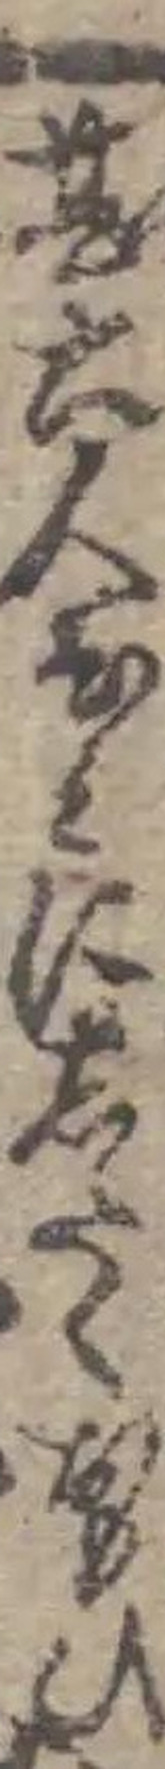甚六人なみにしたくおもひ
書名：津以曽無弟の甚六 3巻
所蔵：国立国会図書館 National Diet Library, JAPAN
